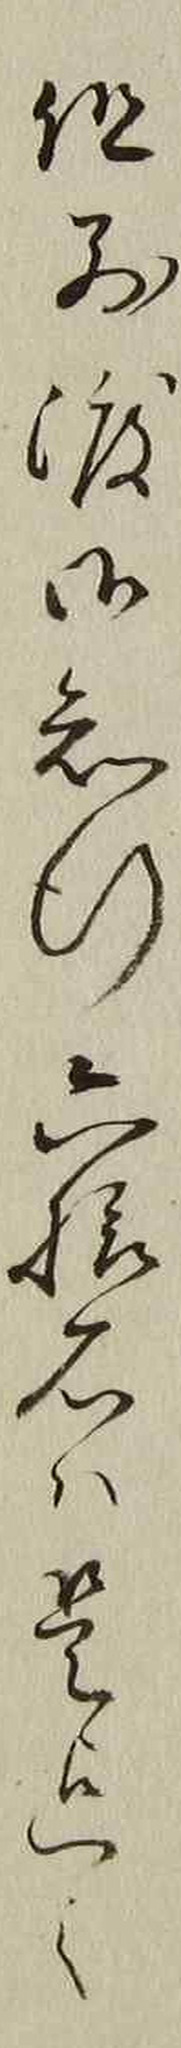但別渡御知行六拾石ハ是迄之
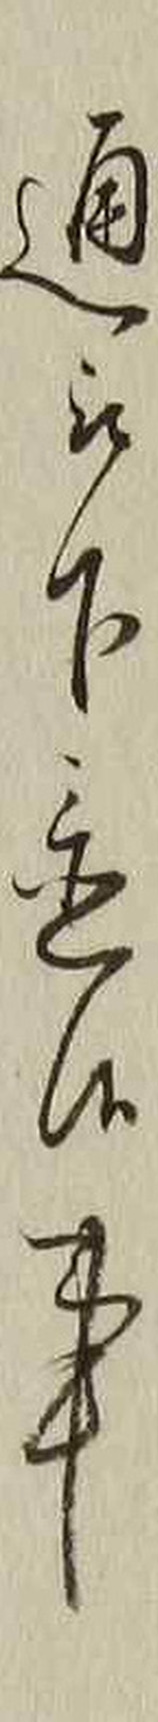通被下置候事
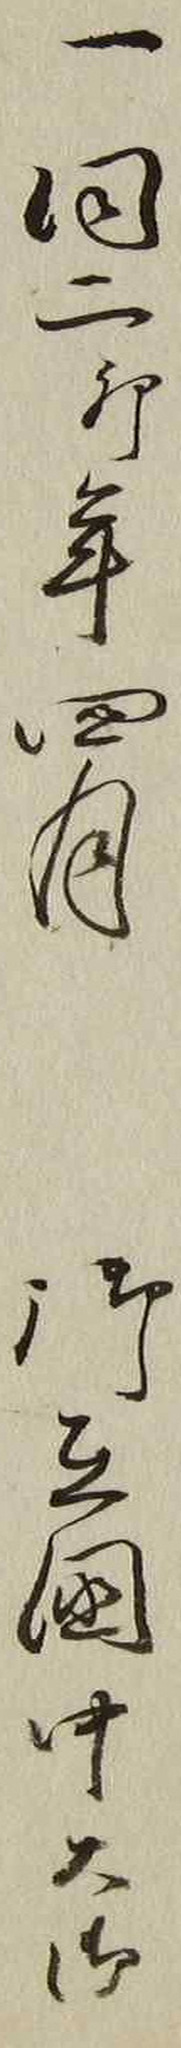一同二卯年四月御在国中大御
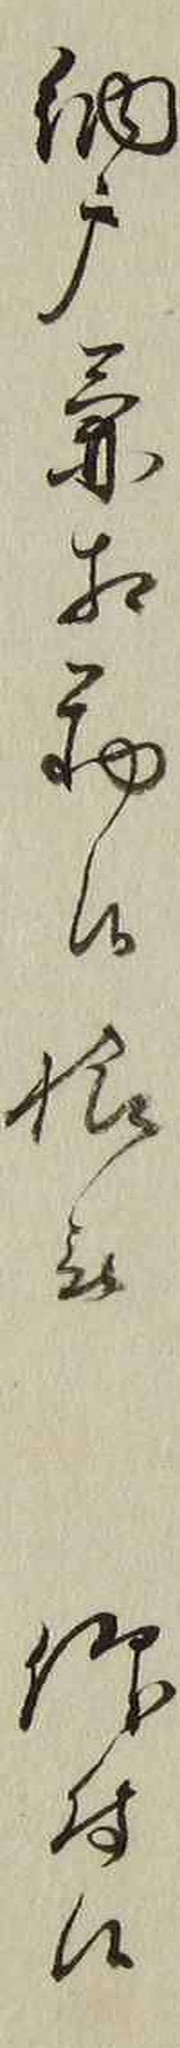納戸兼相勤候様被仰付候事
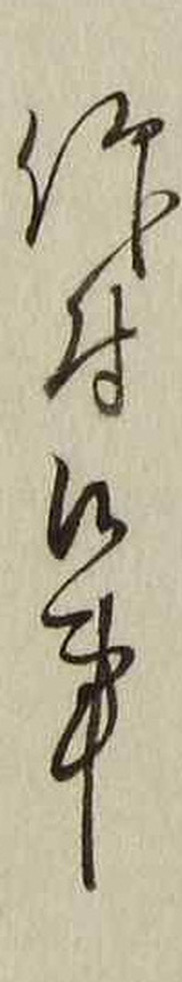仰付候事
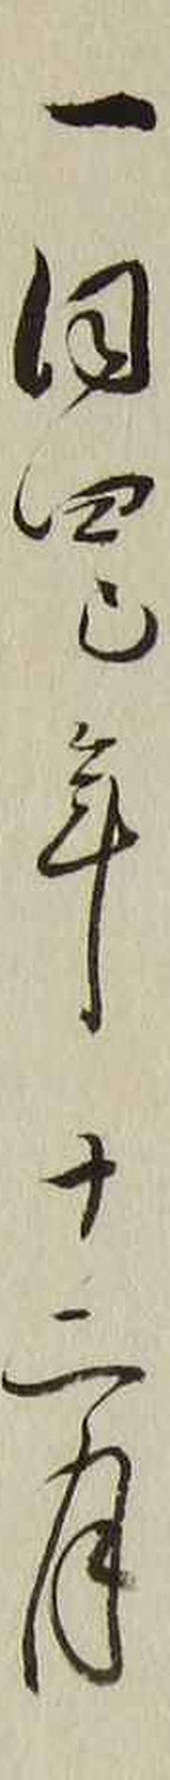一同四巳年十二月
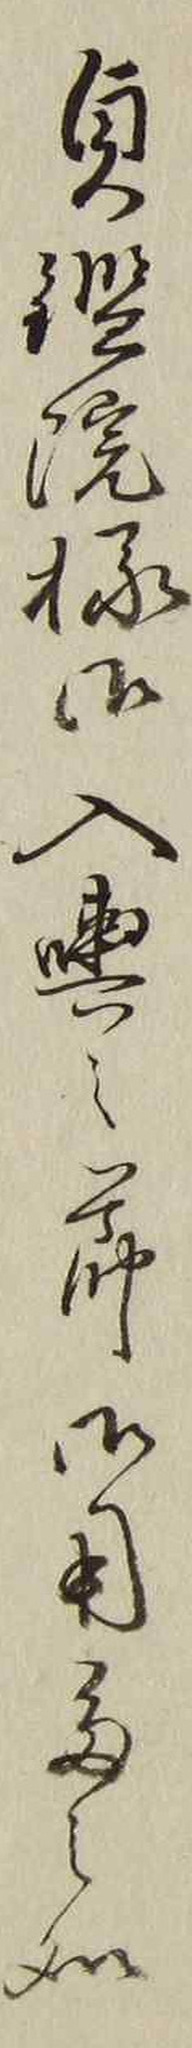貞鑑院様御入輿之節御用多之処

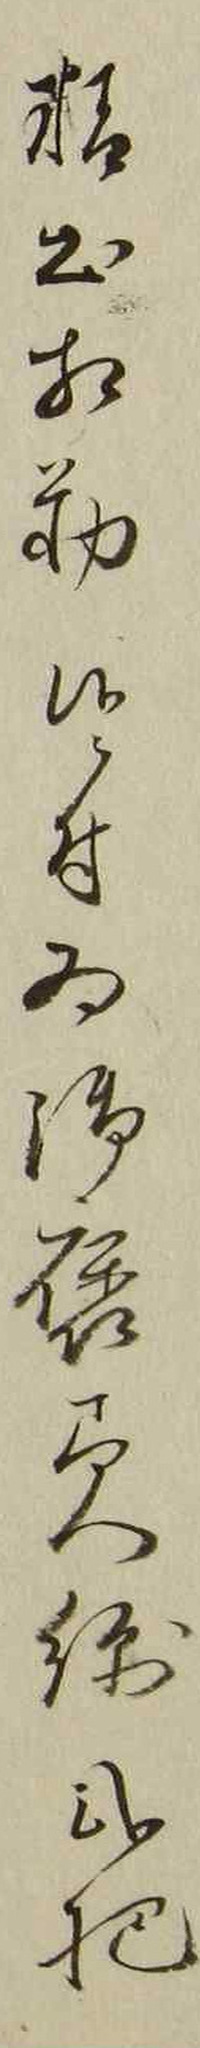精出相勤候ニ付意御褒美綿弐把
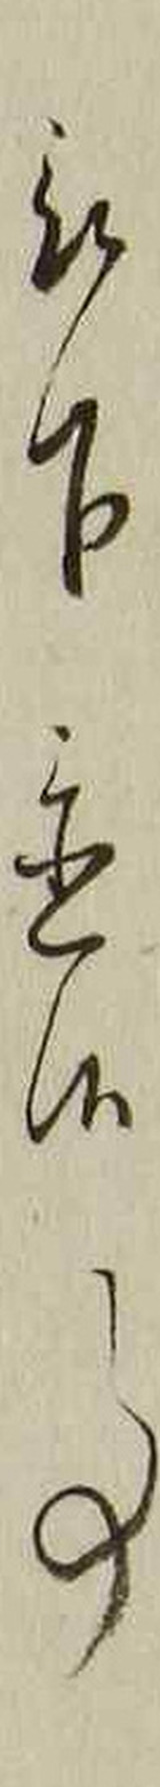被下置候事
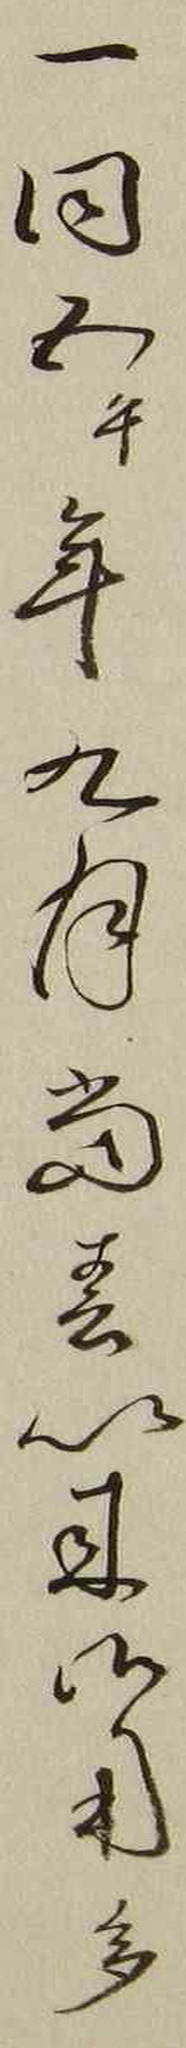一同五午年九月当春以来御用多
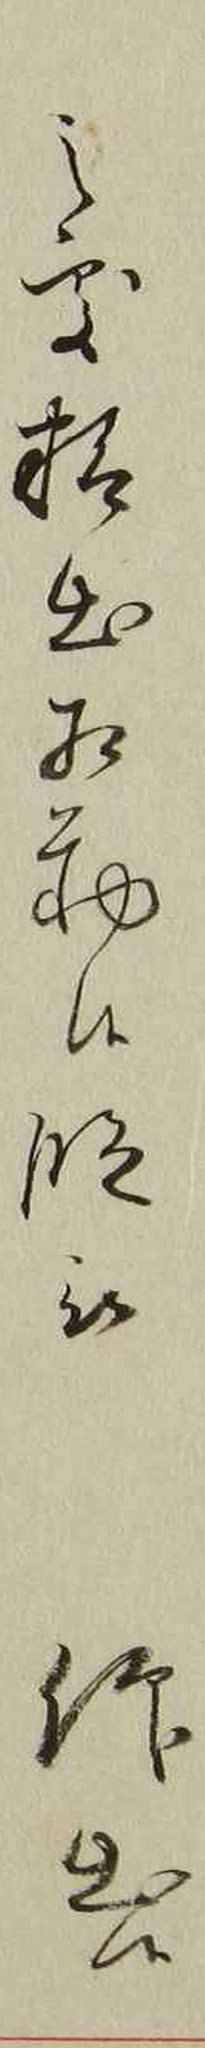之処精出相勤候段被仰出候
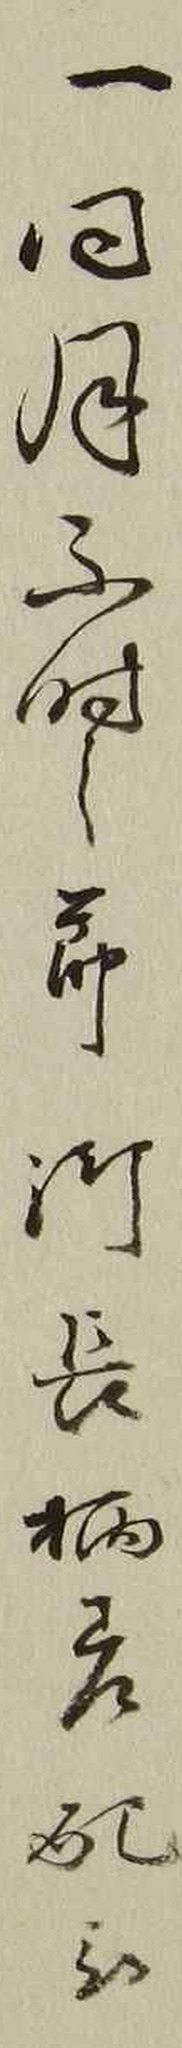一同月不時之節御長柄差配被
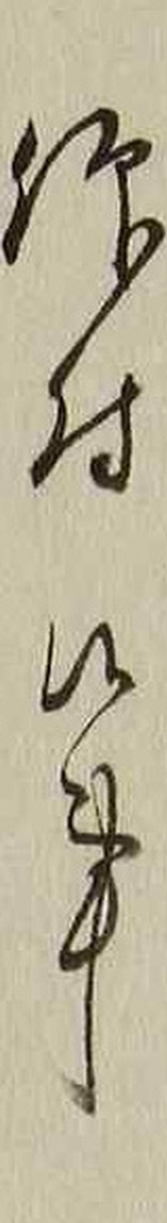仰付候事
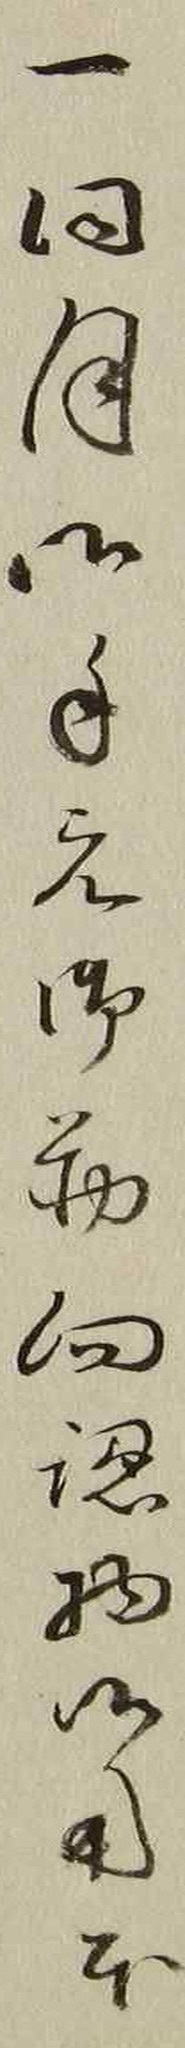一同月御手元御勤向認物御用本
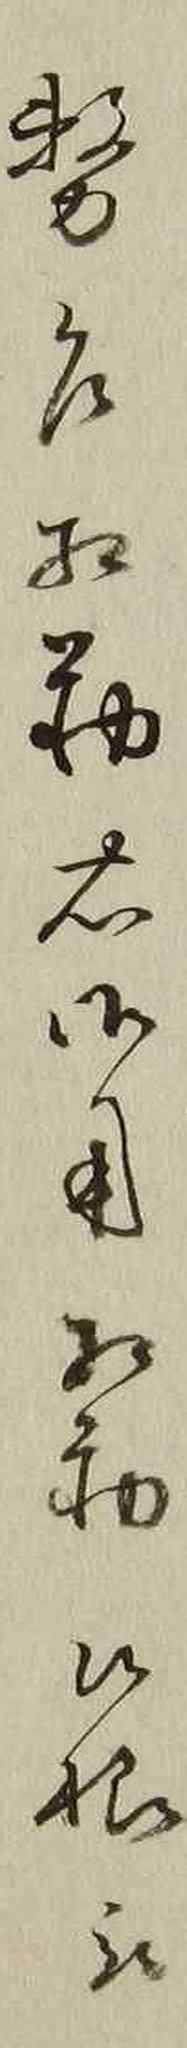務乍相勤右御用相勤候様被
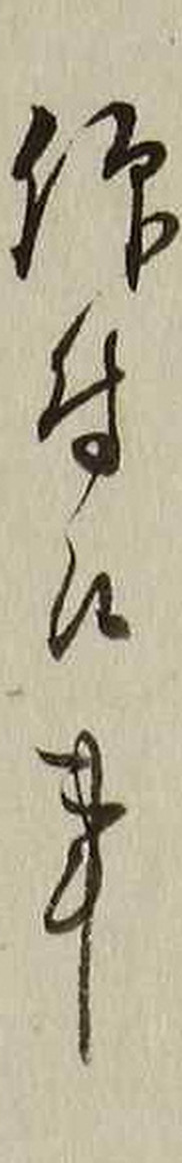仰付候事
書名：諸士系譜　巻之4　い之部4
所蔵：会津若松市立会津図書館
